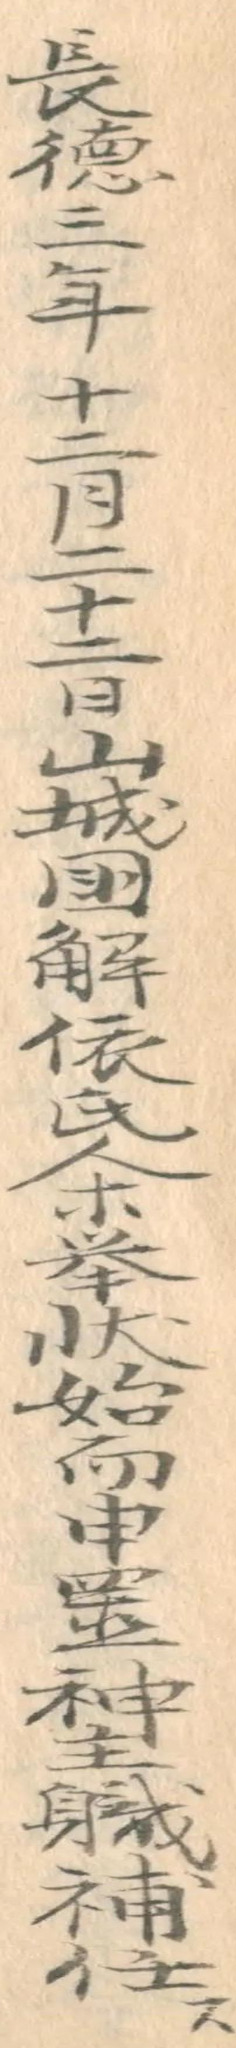在實長徳三年十二月二十二日山城国解依氏人等挙状始而申置神主職補仕ス
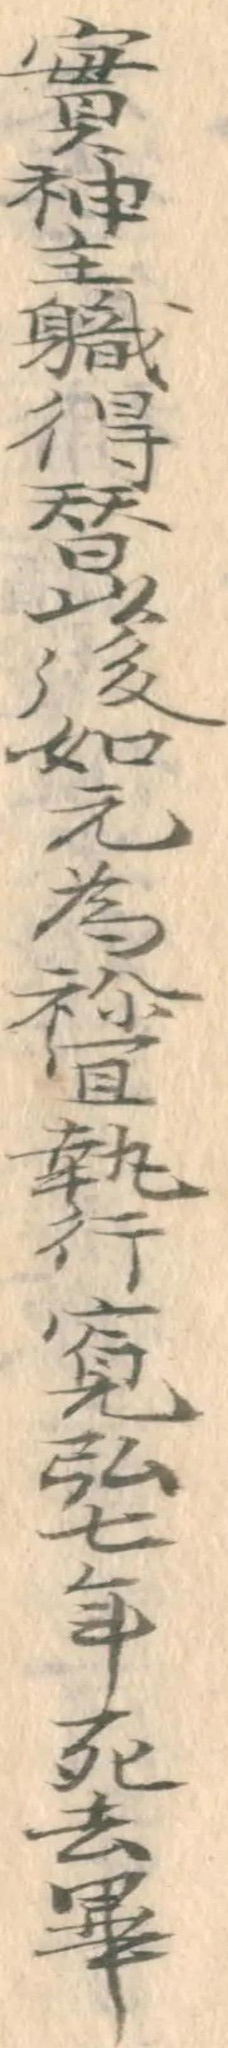實神主職得替以後如元為祢宜執行寛弘七年死去畢
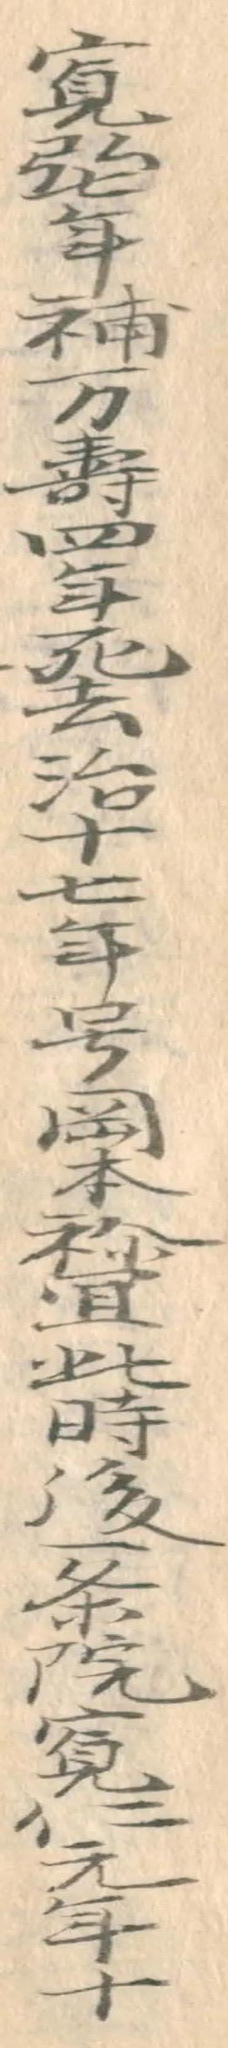周忠寛弘七年補万寿四年死去治十七年号岡本祢宜此時後一条院寛仁元年十
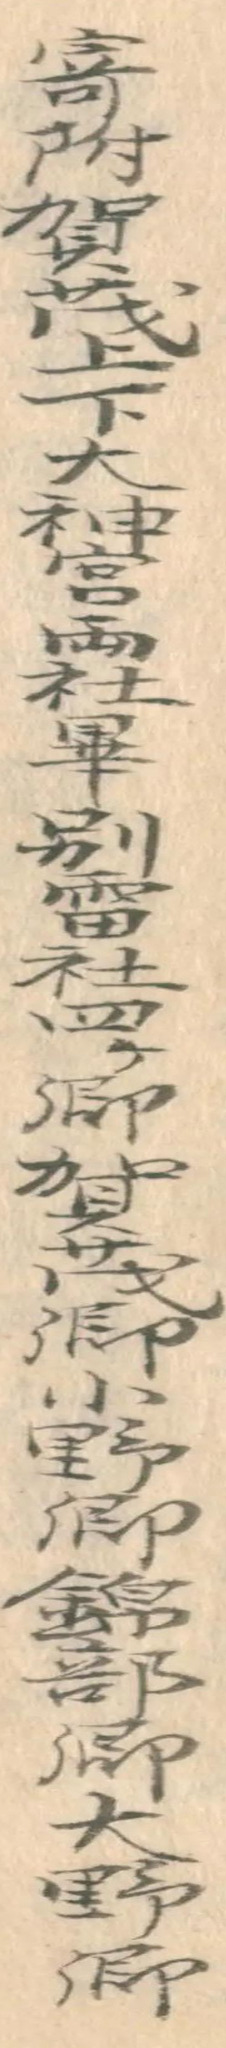寄附賀茂上下大神宮両社畢別雷社四ヶ郷賀茂郷小野郷錦部郷大野郷
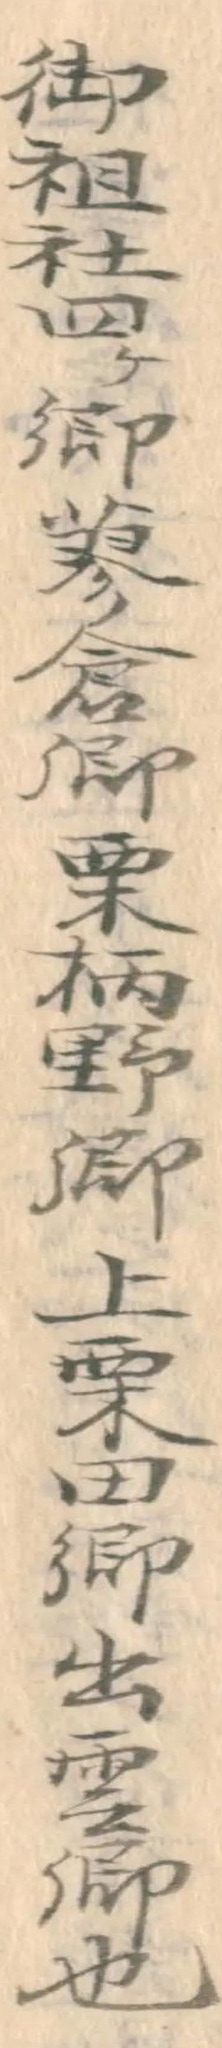御祖社四ケ郷蓼倉郷栗柄野郷上栗田郷出雲郷也
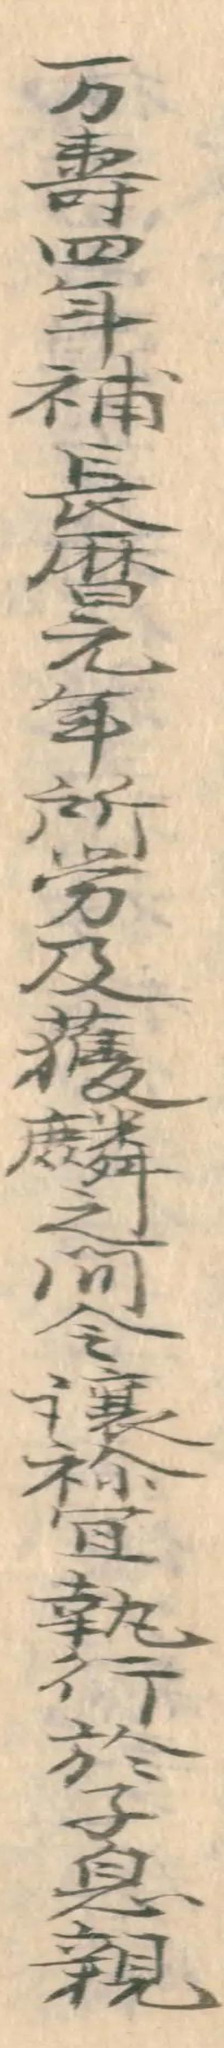安頼万寿四年補長暦元年所労及獲麟之間令譲祢宜執行於子息親
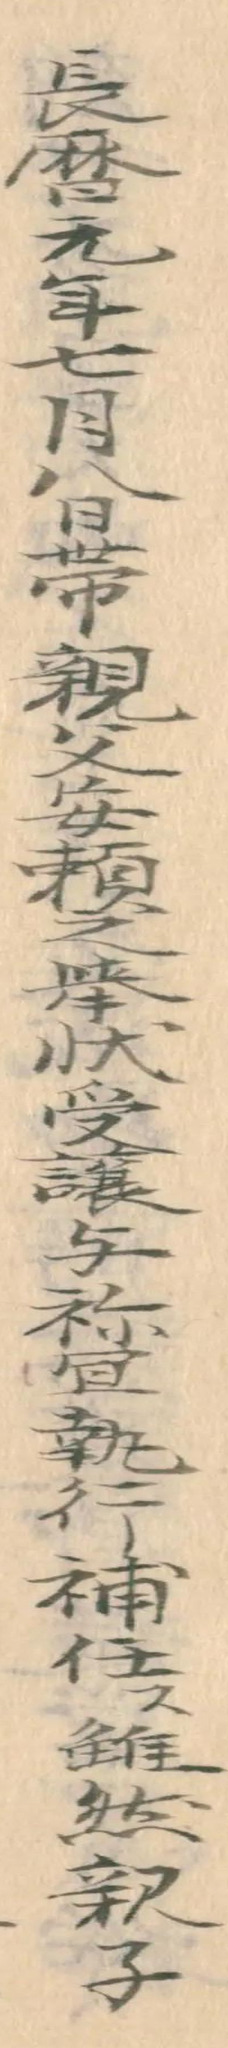親経長歴元年七月八日帯親父安頼之挙状受譲与祢宜執行補任ス雖然親子
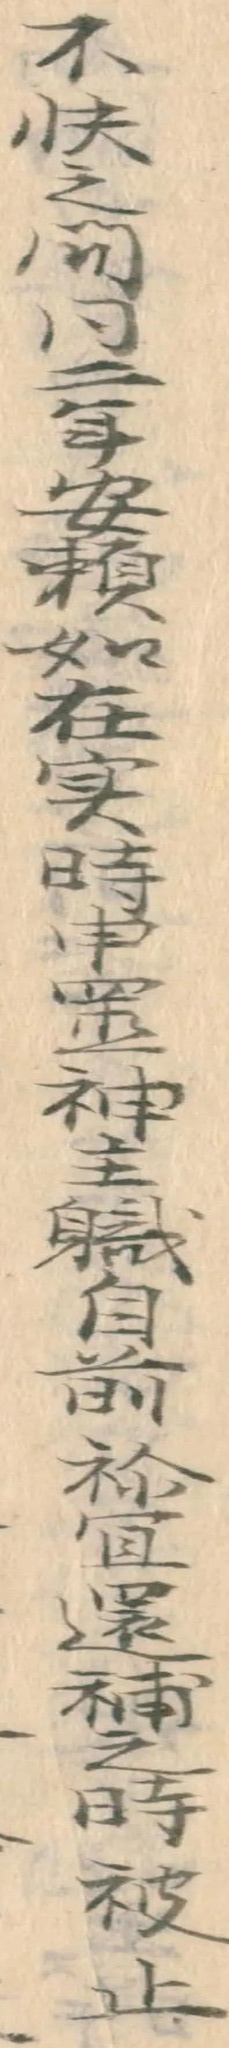不快之間同二年安頼如在実時申置神主職自前祢宜還補之時被止
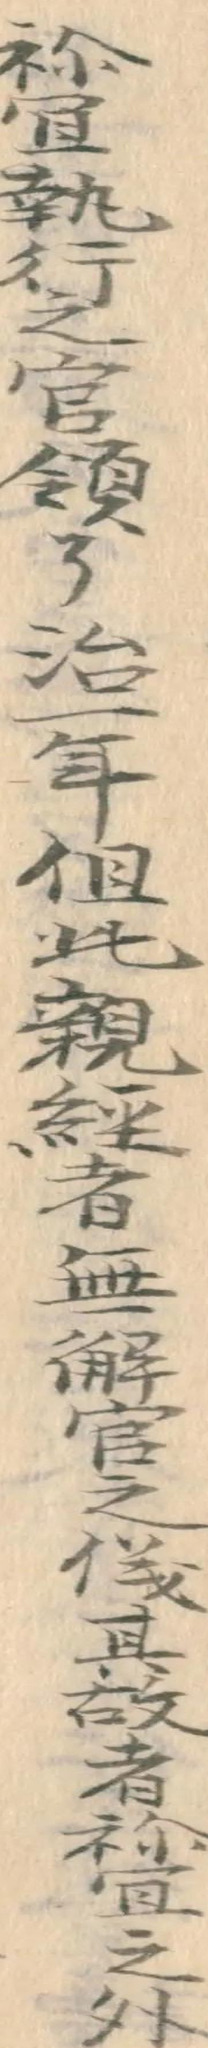祢宜執行之官領了治一年但此親経者無解官之儀其故者祢宜之外
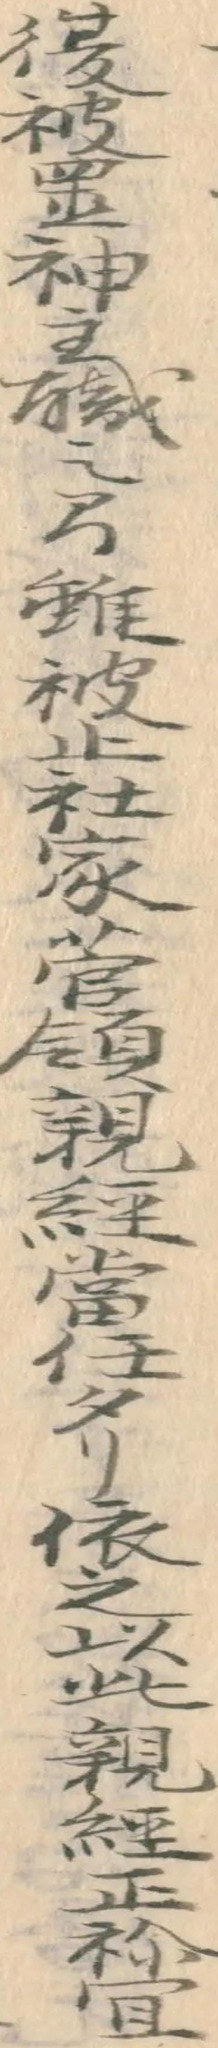復被置神主職之間雖被止社家菅領親経当任タリ依之以此親経正祢宜
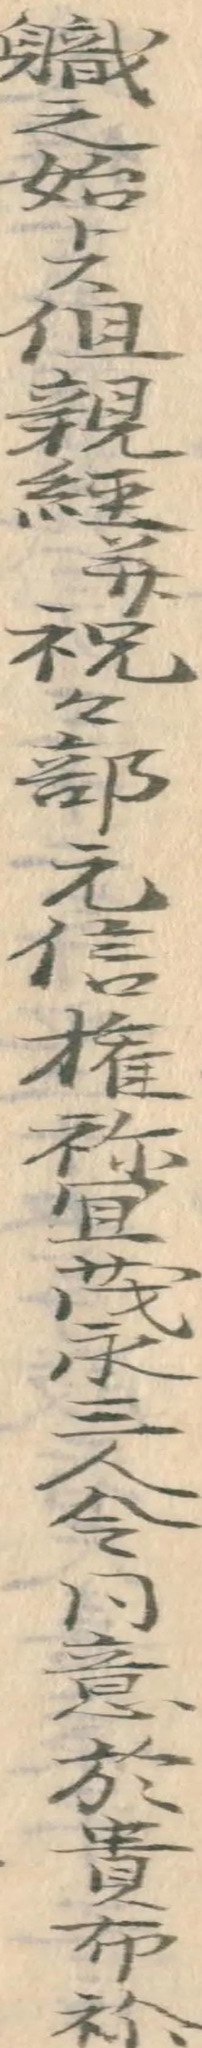職之始トス但親経并祝々部元信権祢宜茂永三人令同意於貴布祢
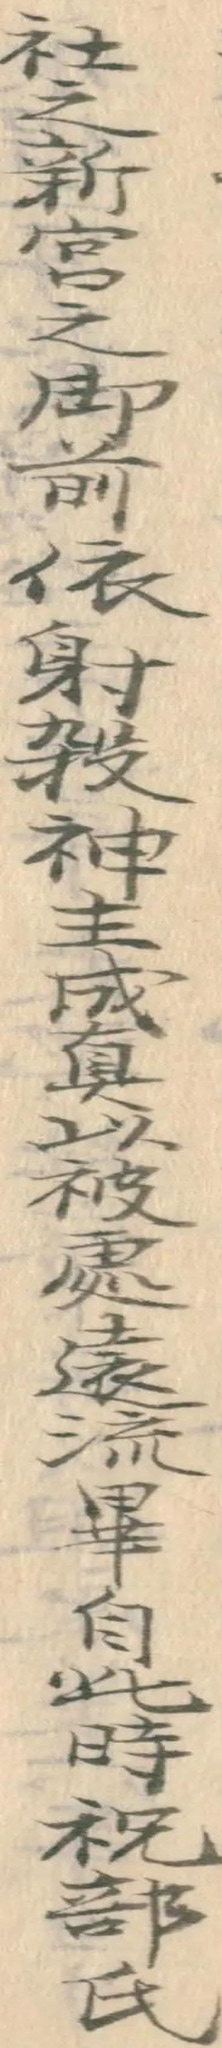社之新宮之御前依射殺神主成真以被処遠流畢自此時祝部氏
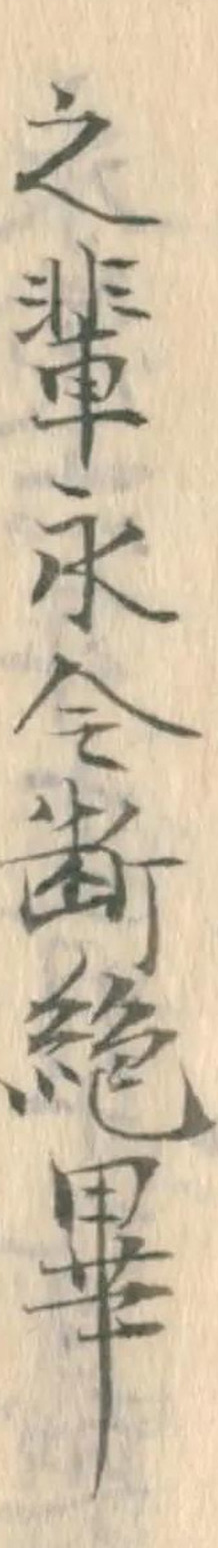之輩永令断絶畢
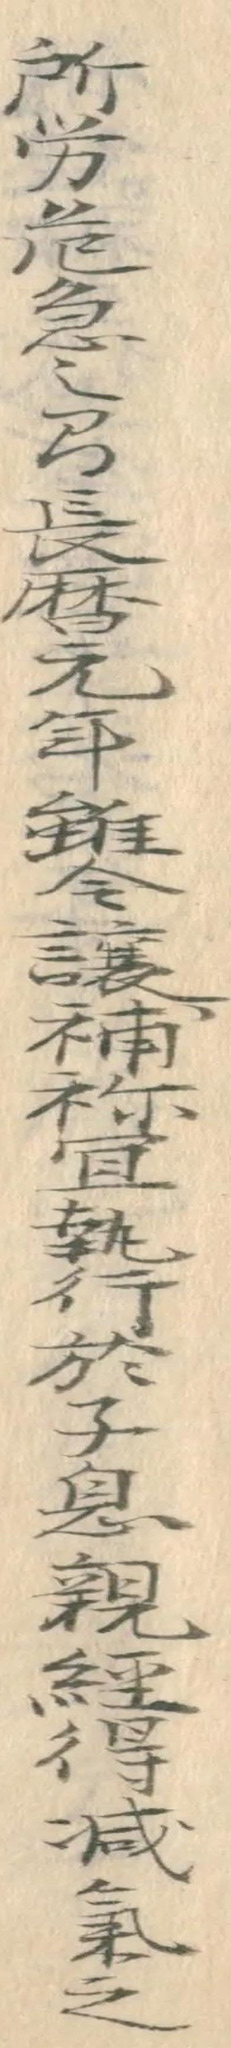安頼所労危急之間長暦元年雖令譲補祢宜執行於子息親経得减気之
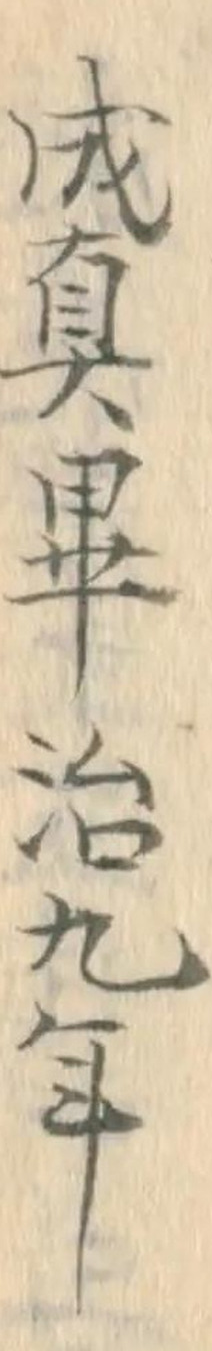成真畢治九年

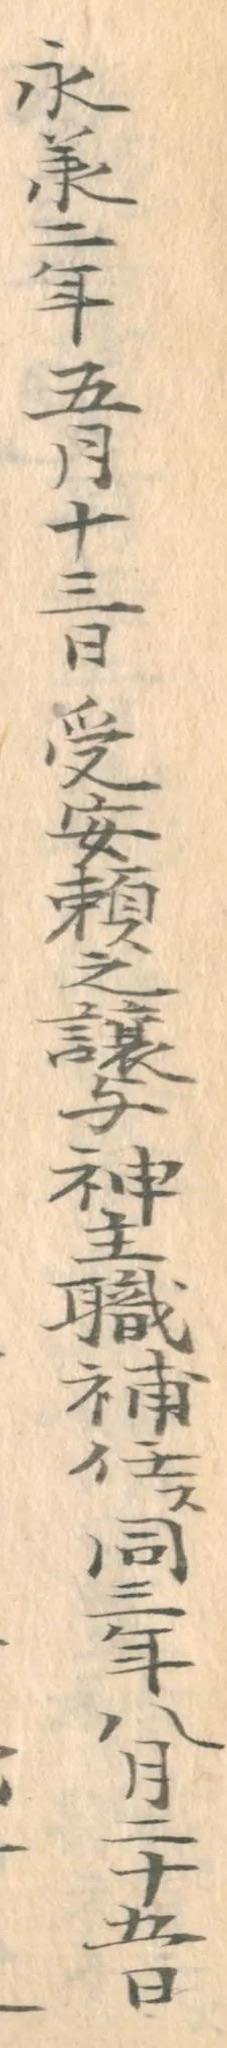成信永承二年五月十三日受安頼之譲与神主職補任ス同三年八月二十五日
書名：賀茂社記録. 第24冊
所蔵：国立国会図書館 National Diet Library, JAPAN
